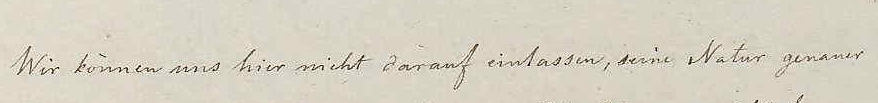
Wir können uns hier nicht darauf einlassen, seine Natur genauer
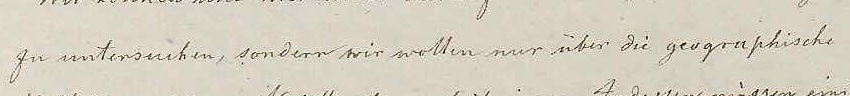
zu untersuchen, sondern wir wollen nur über die geographische
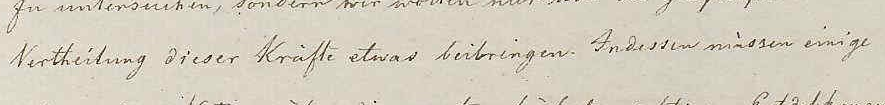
Vertheilung dieser Kräfte etwas beibringen. Indessen müssen einige
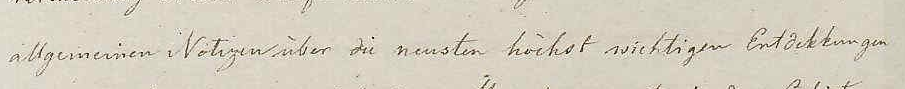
allgemeinen Notizen über die neusten höchst wichtigen Entdekkungen
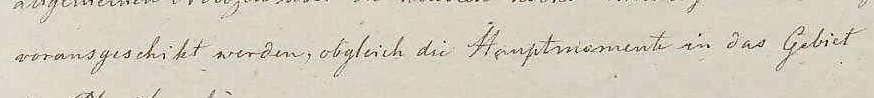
vorausgeschikt werden, obgleich die Hauptmomente in das Gebiet
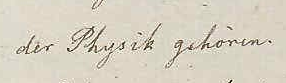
der Physik gehören.
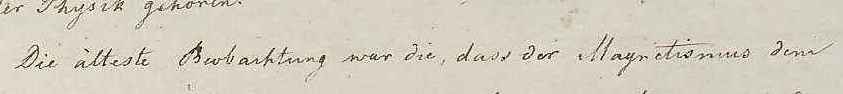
Die älteste Beobachtung war die, dass der Magnetismus dem
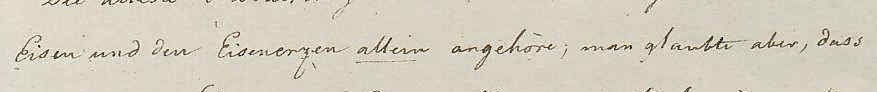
Eisen und den Eisenerzen allein angehöre; man glaubte aber, dass
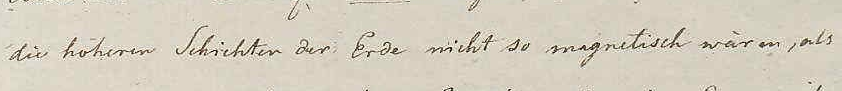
die höheren Schichten der Erde nicht so magnetisch wären, als
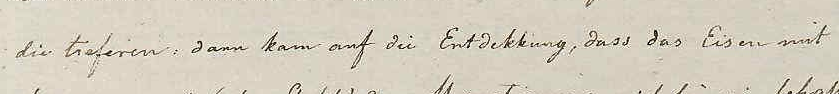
die tieferen: dann kam auf die Entdekkung, dass das Eisen mit
